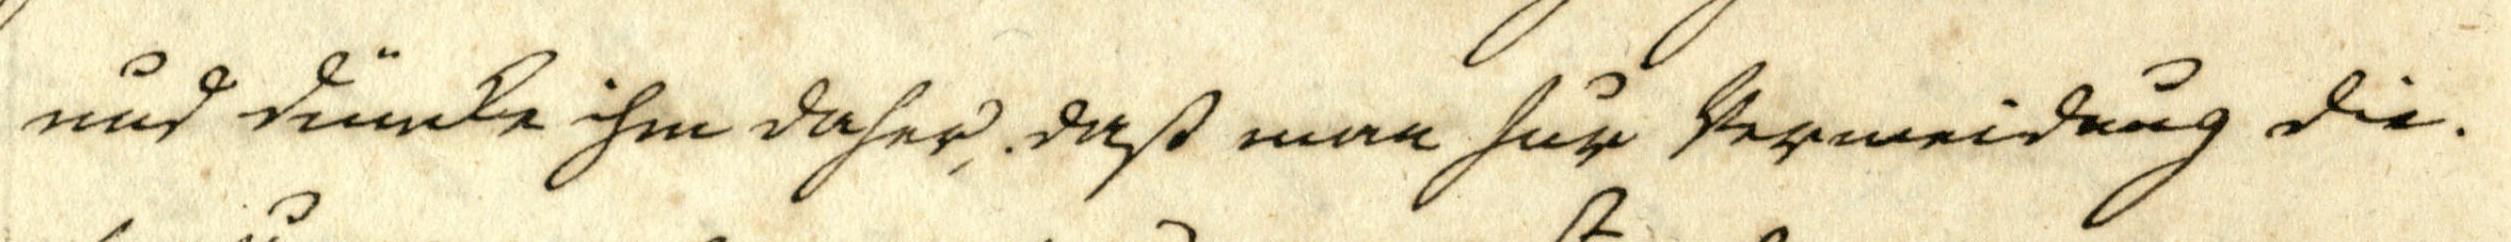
und düncke ihm daher, daß man zur Vermeidung die¬
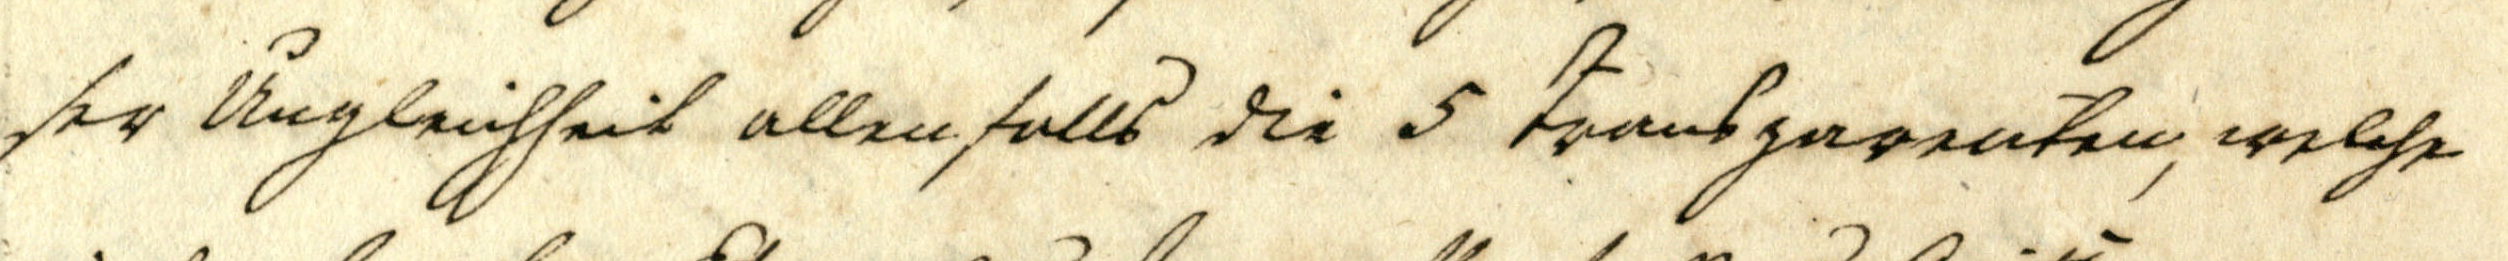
ser Ungleichheit allen falls die 5 Transparenten, welche
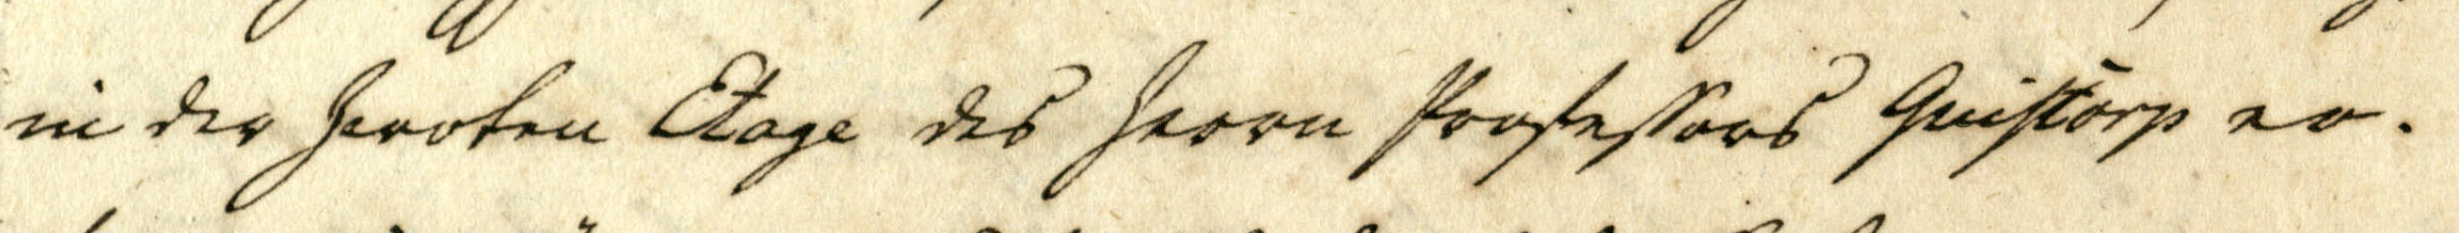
in der zwoten Etage des Herrn Professors Quistorp er¬
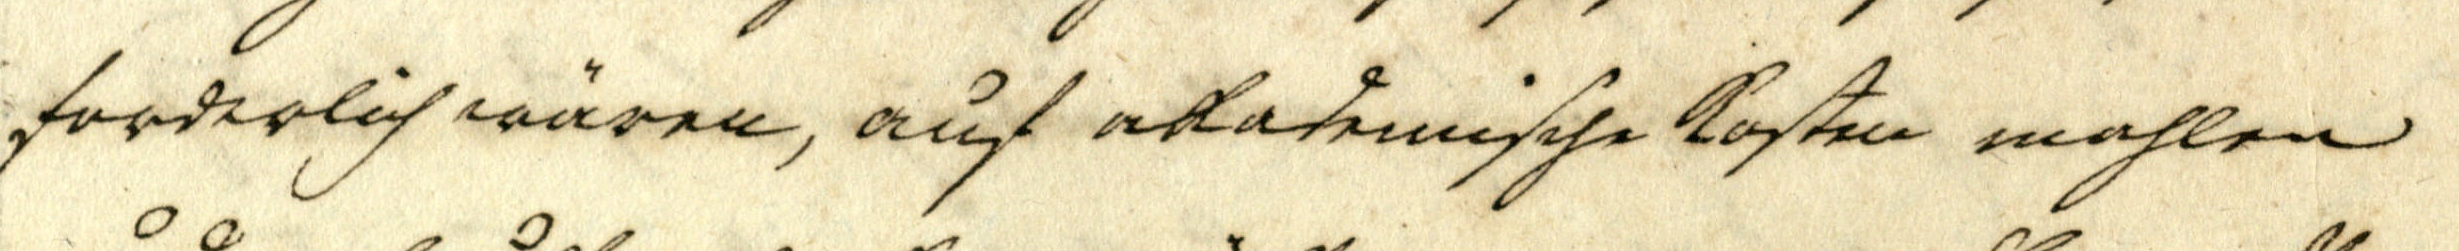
forderlich wären, auf akademische Kosten mahlen
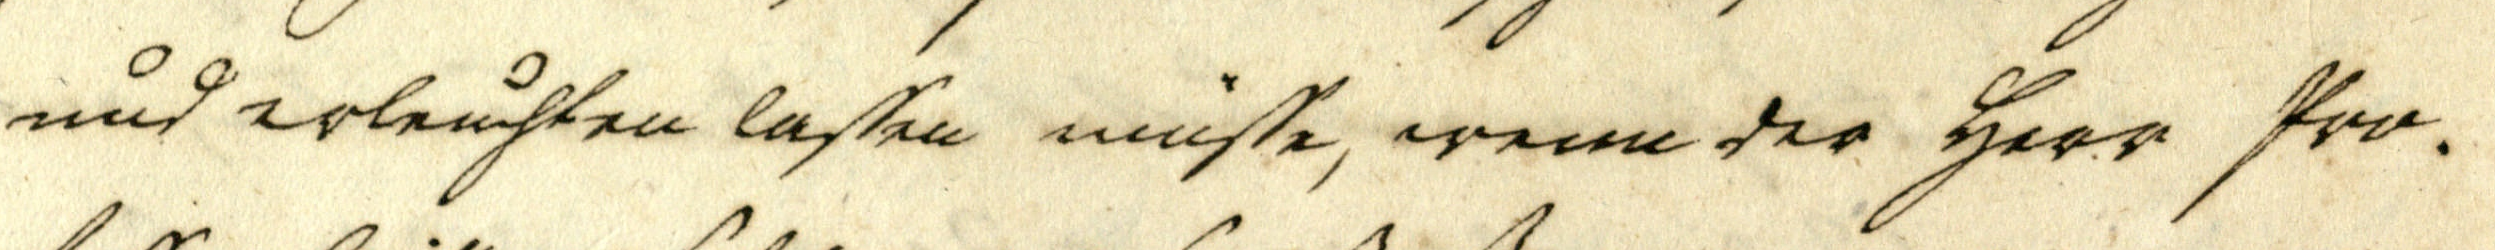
und erleuchten lassen müsse, wenn der Herr Pro¬
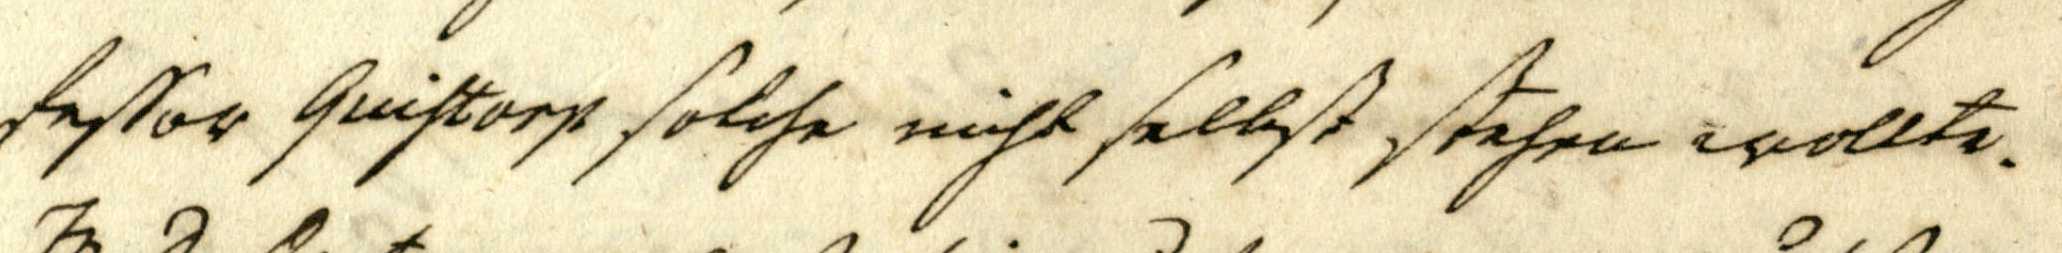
fessor Quistorp solche nicht selbst stehen wollte.
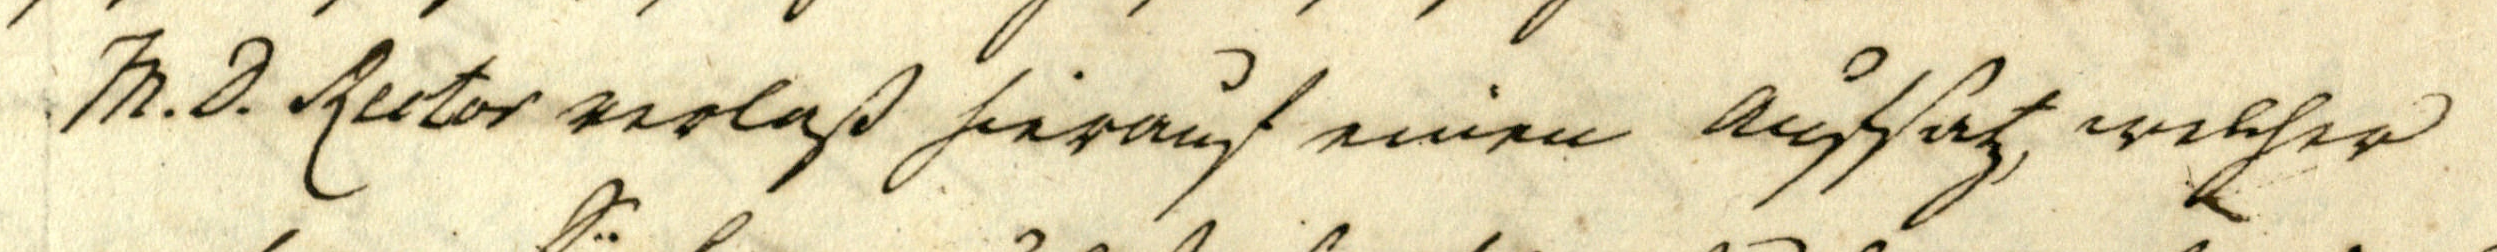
M. D. Rector verlaß hierauf einen Aufsatz, welcher
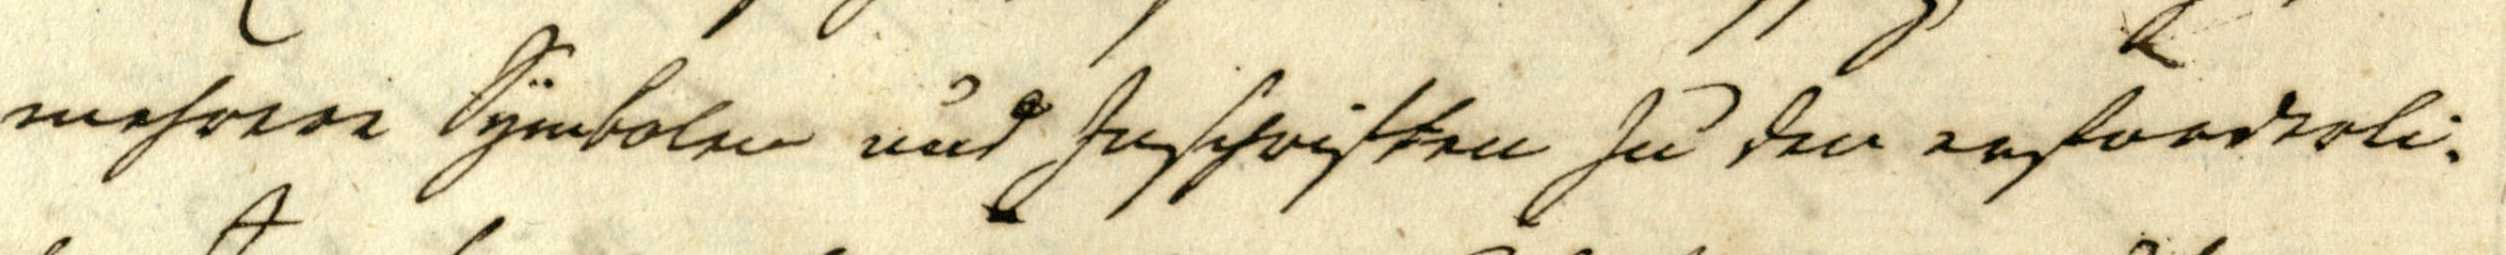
mehrere Sÿmbolen und Inschriften zu dem erforderli¬
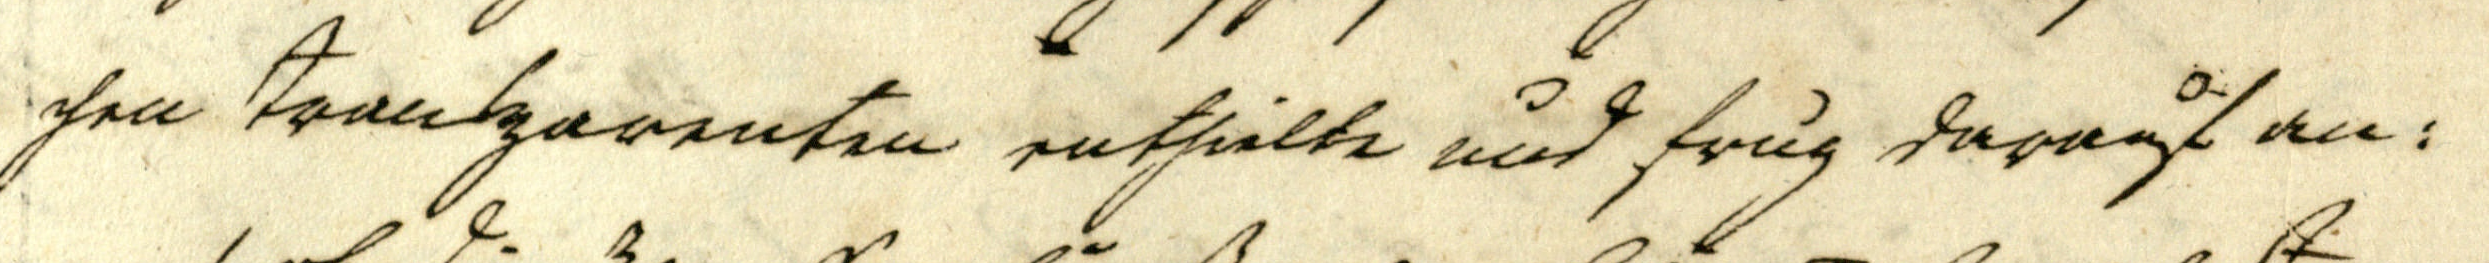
chen Transparenten enthielte und frug darauf an:
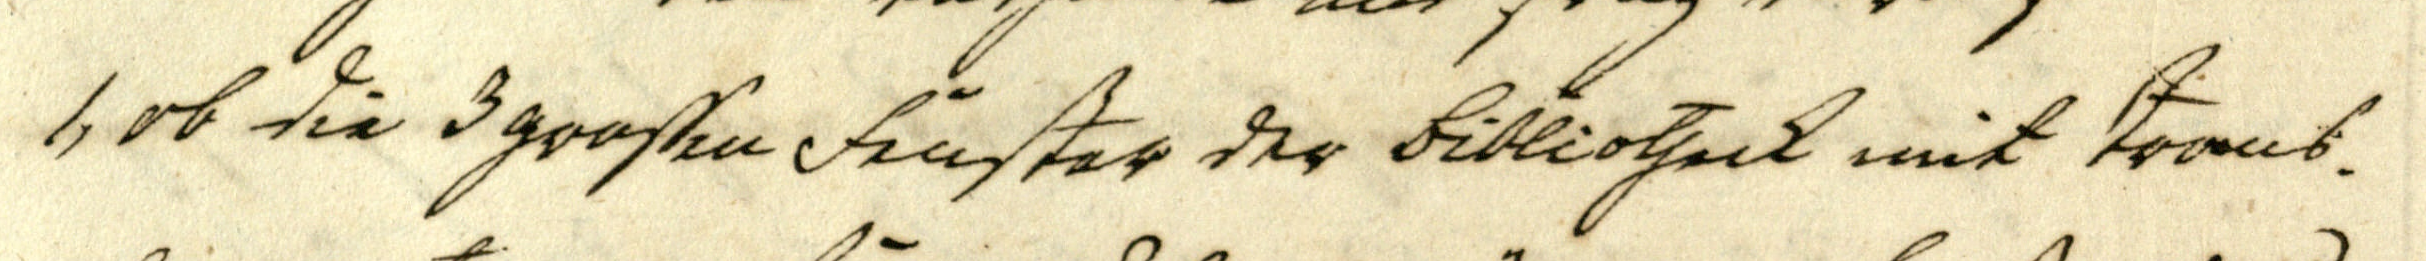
1, ob die 3 grossen Fenster der Bibliotheck mit Trans¬
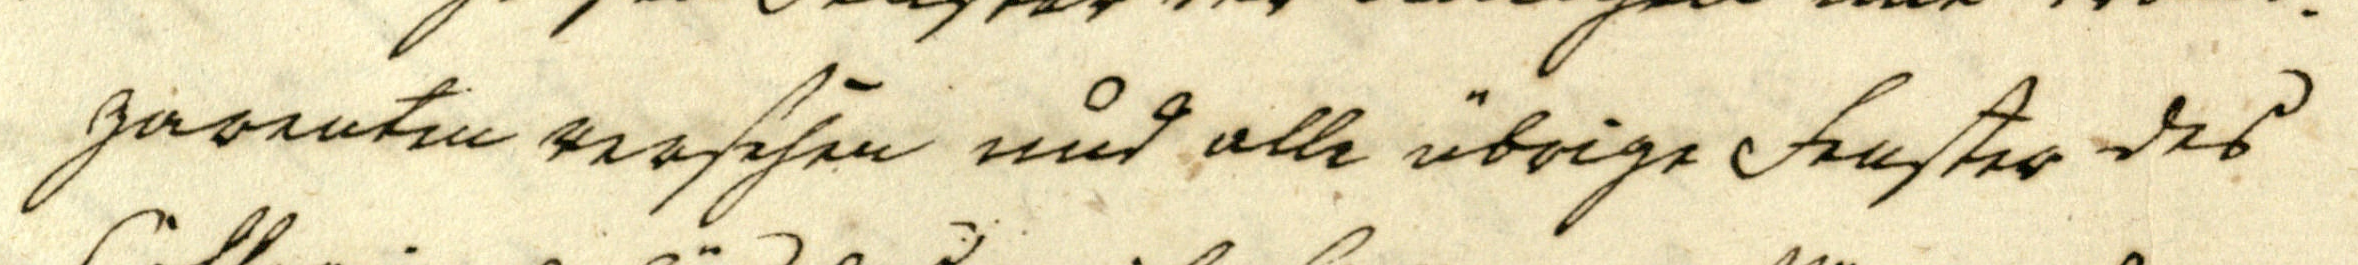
parenten versehen und alle übrige Fenster des
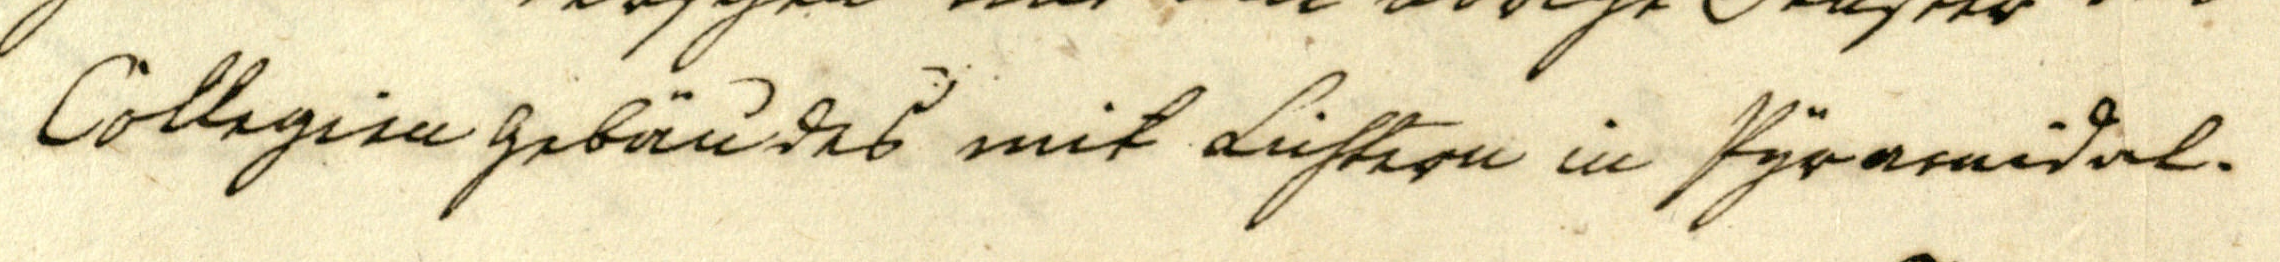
Collegien Gebäudes mit Lichtern in Pyramidal¬
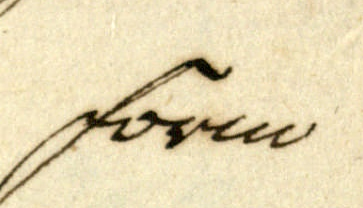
form
